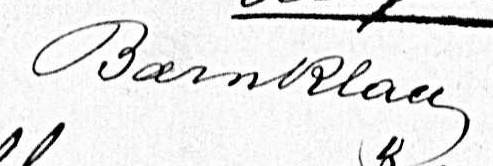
Baernklau
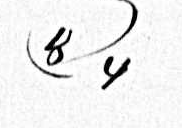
8/4
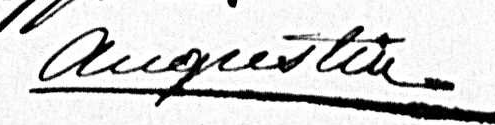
Augustin
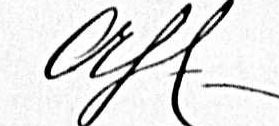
AH
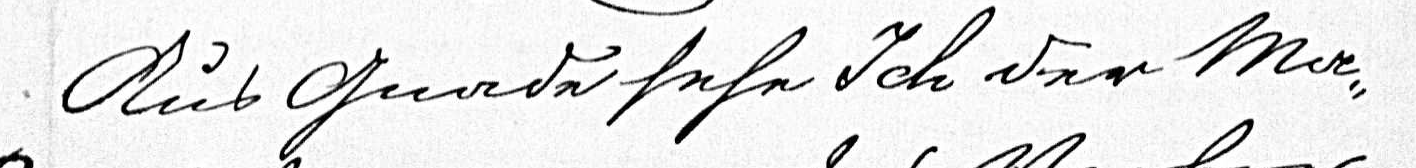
Aus Gnade sehe Ich der Ma¬
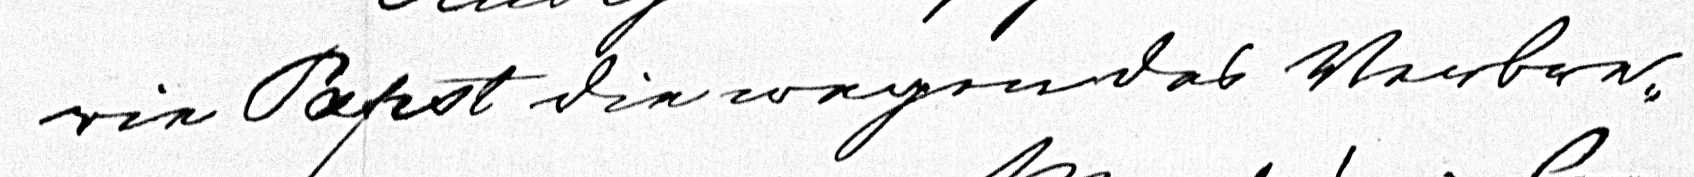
rie Papst die wegen des Verbre¬
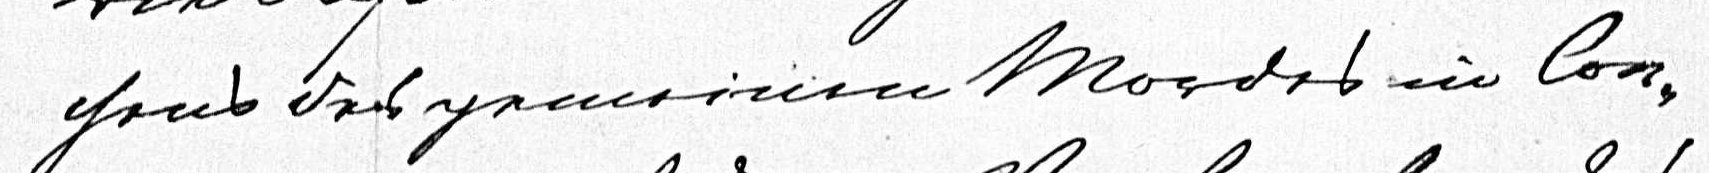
chens des gemeinen Mordes in Con¬
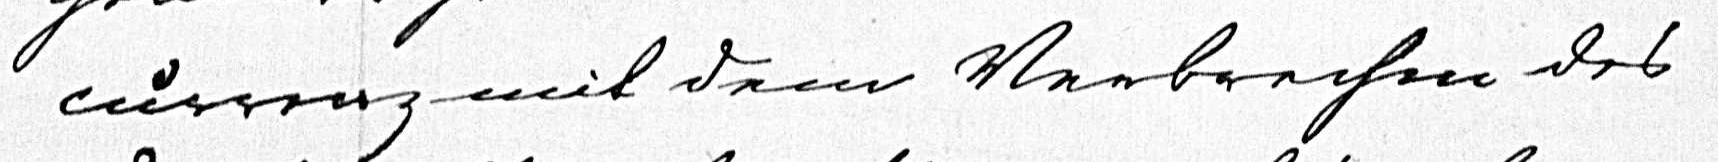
currenz mit dem Verbrechen des
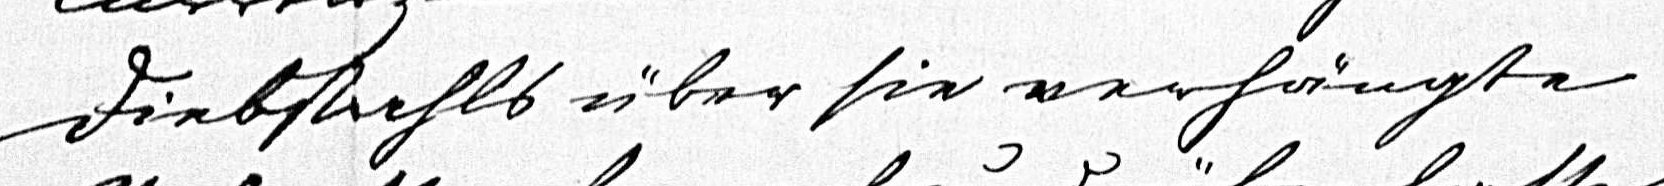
Diebstahls über sie verhängte
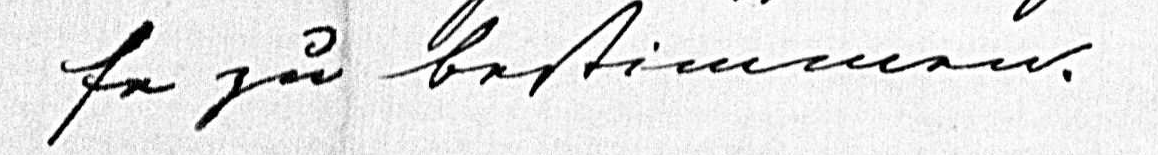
fe zu bestimmen.
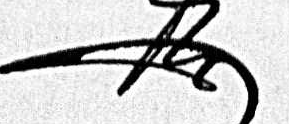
FJ
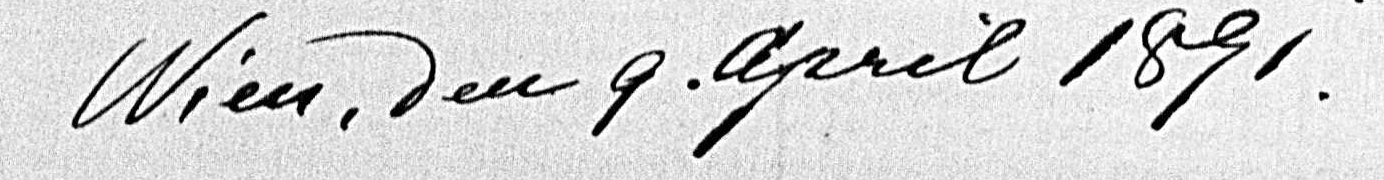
Wien, den 9. April 1891
